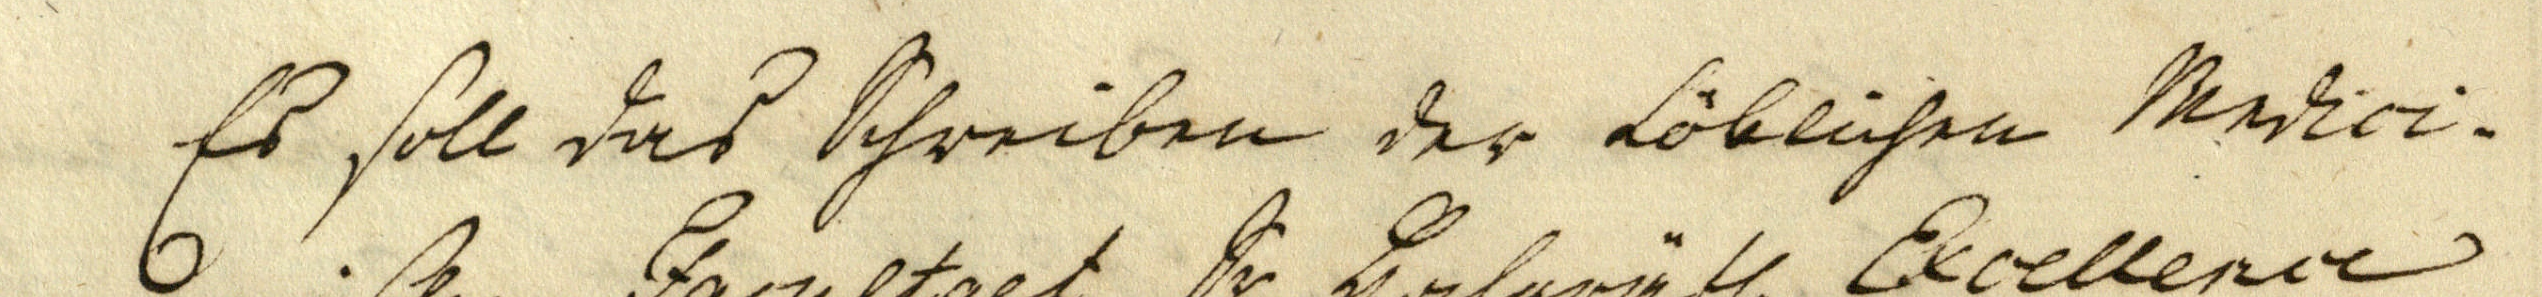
Es soll das Schreiben der Löblichen Medici-
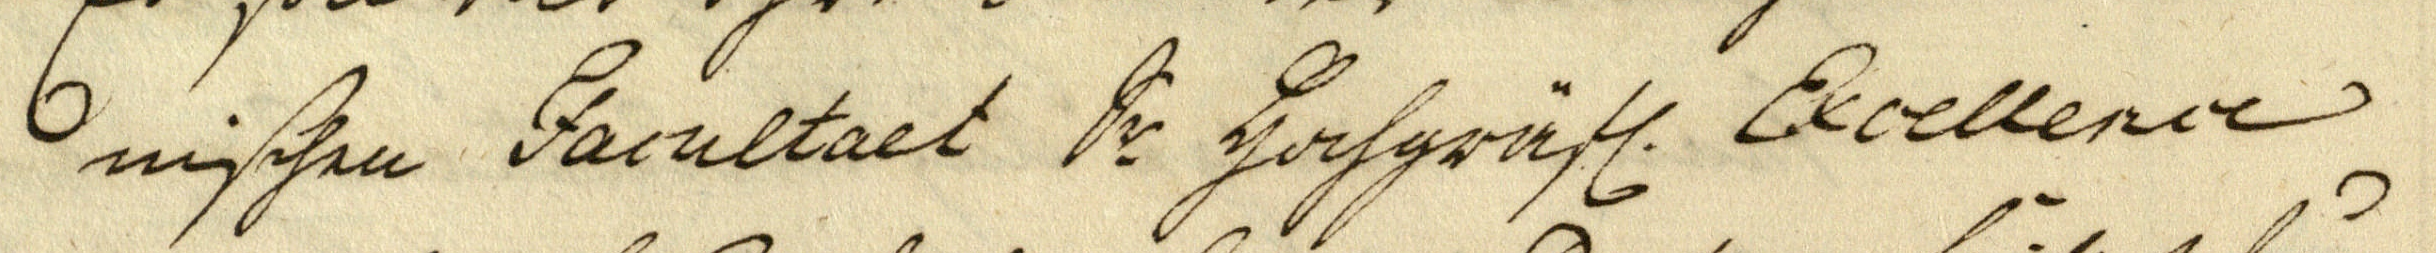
nischen Facultaet Sr. Hochgräfl. Excellence
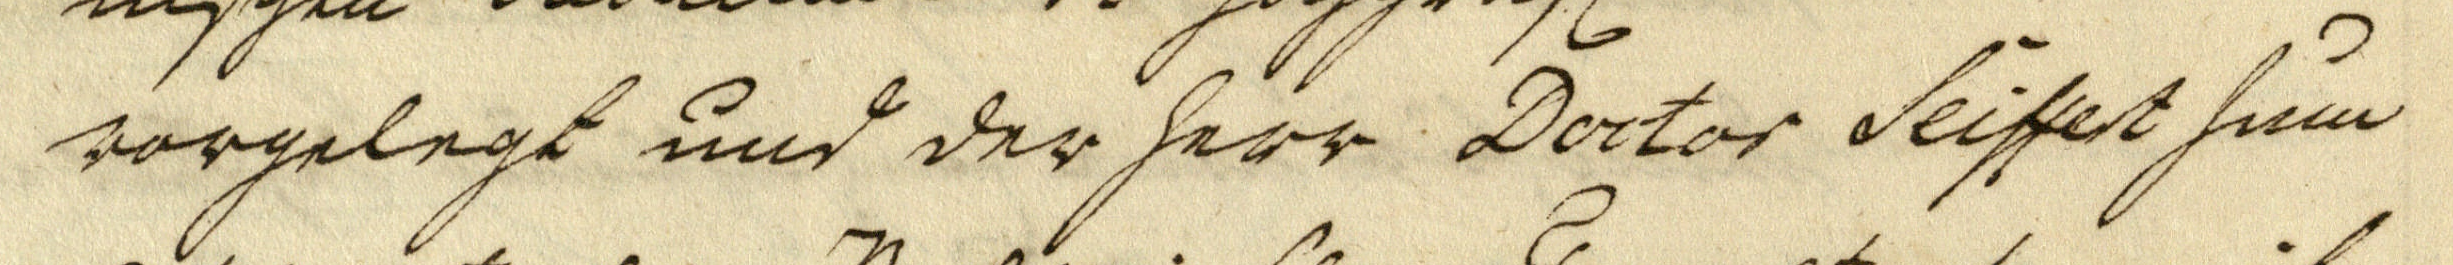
vorgelegt und der herr Doctor Seiffert zum
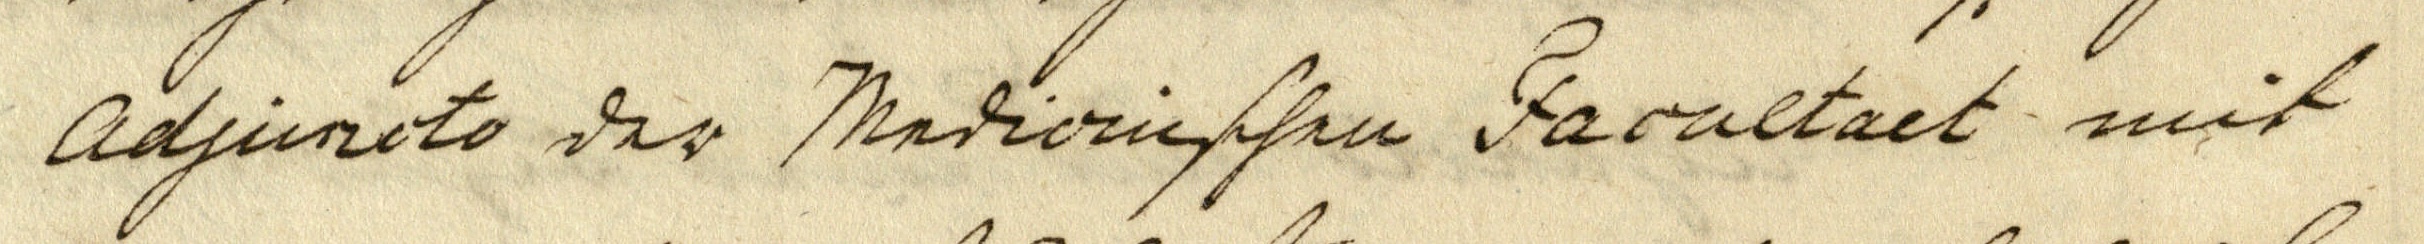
Adjuncto der Medicinischen Facultaet mit
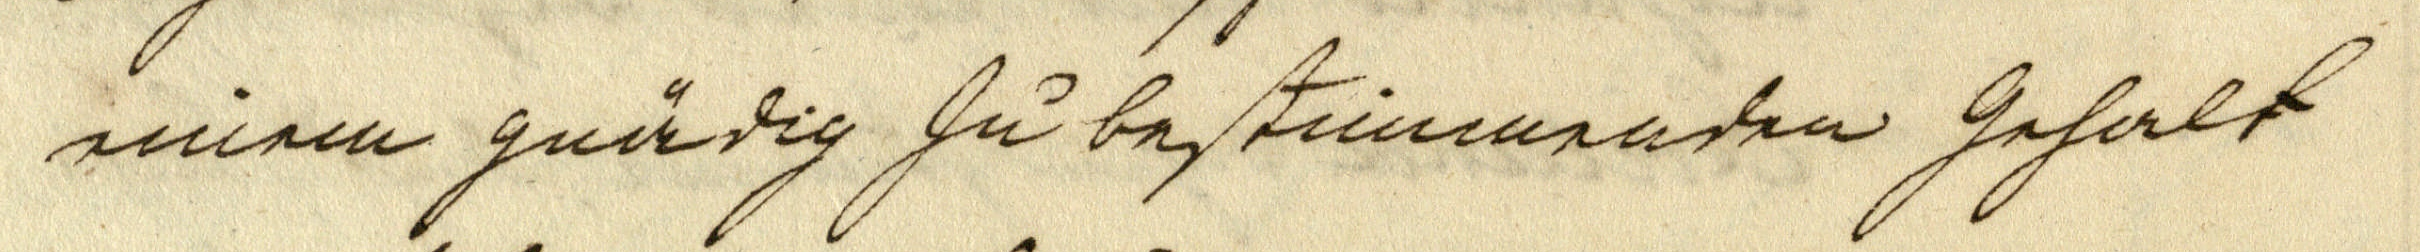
einem gnädig zu bestimmenden Gehalt
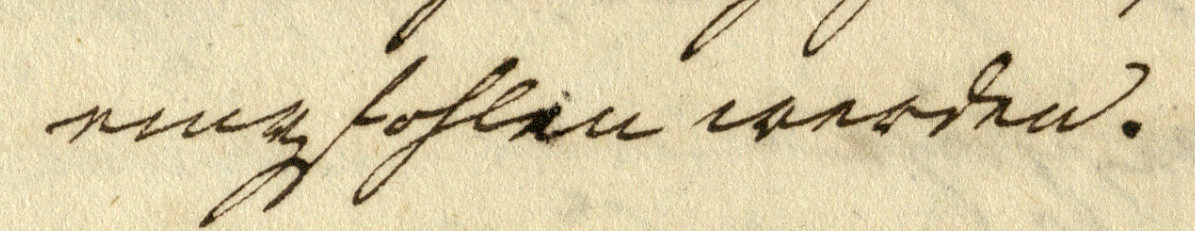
empfohlen werden.
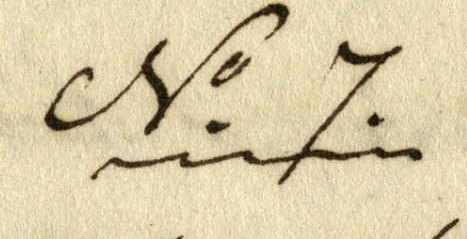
No. 7.
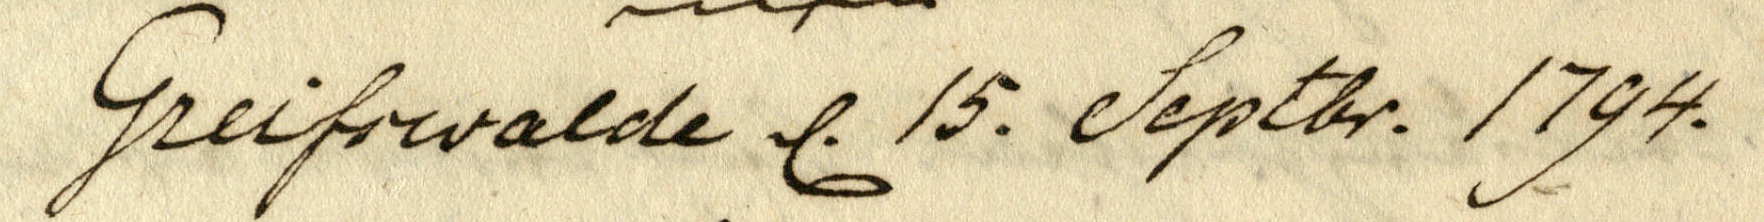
Greifswalde d. 15. Septbr. 1794
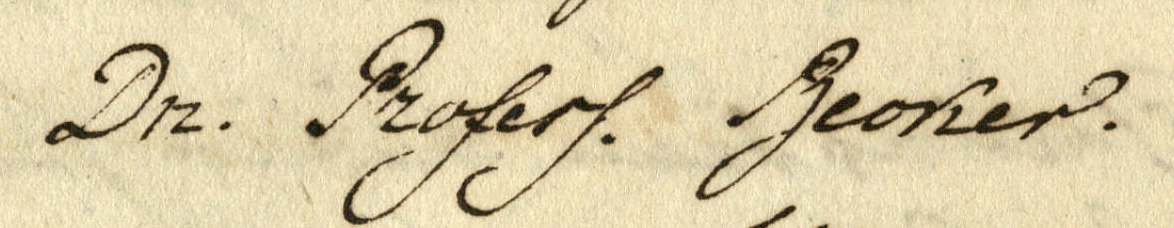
Dn. Profess. Becker.
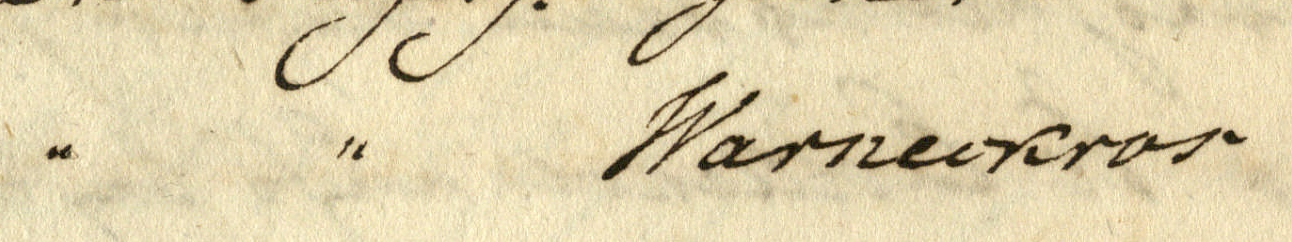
" " Warneckros
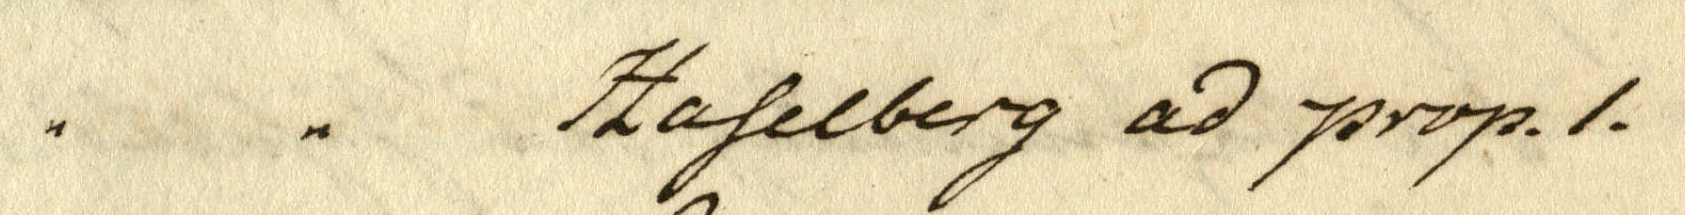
" " Haselberg ad prop. 1.
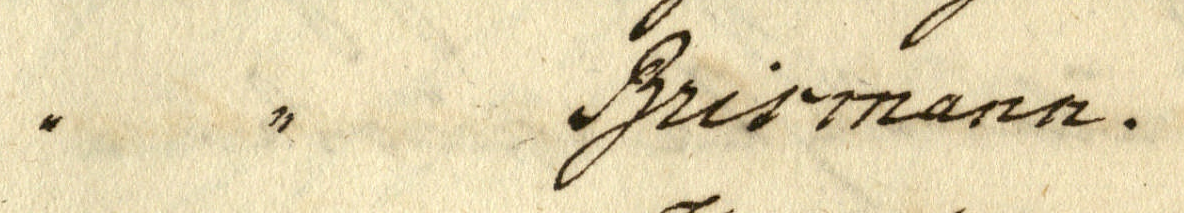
" " Brismann.
